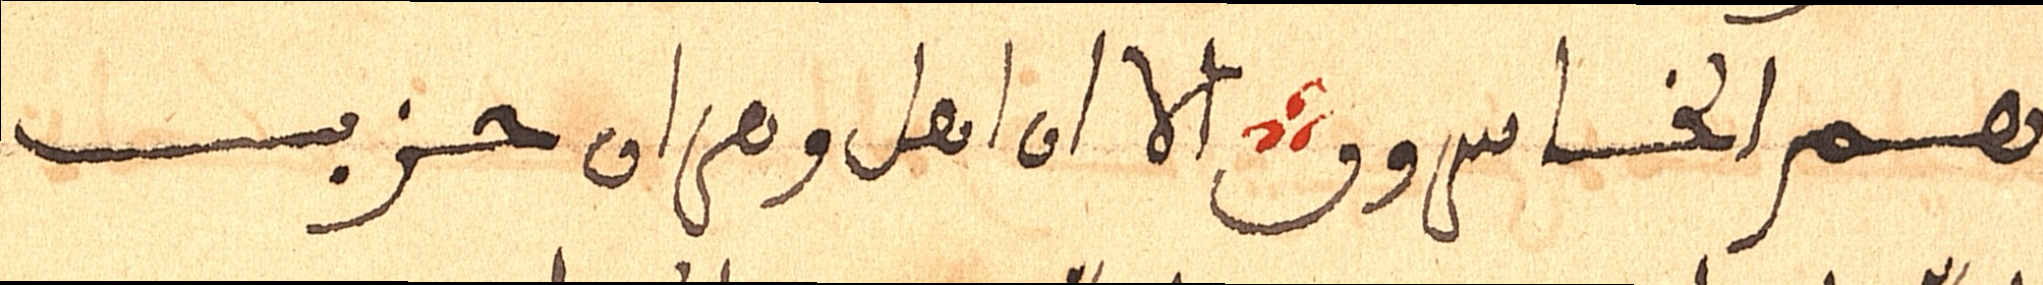هم الخاسرون الا ان اهل وهران حزب
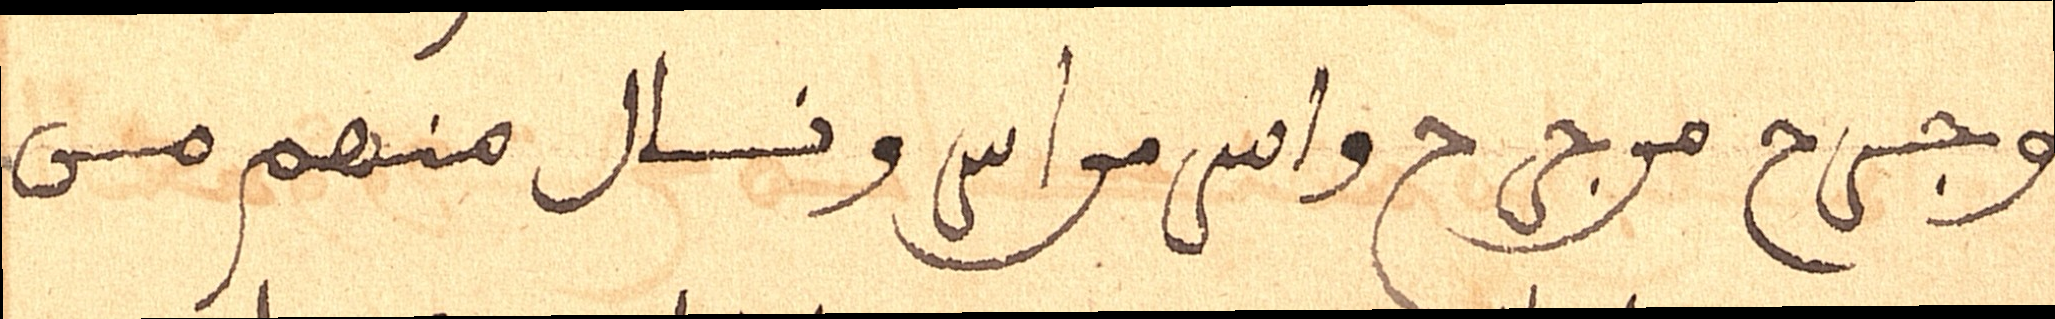وخرج من جرح واسر من اسر ونال منهم من
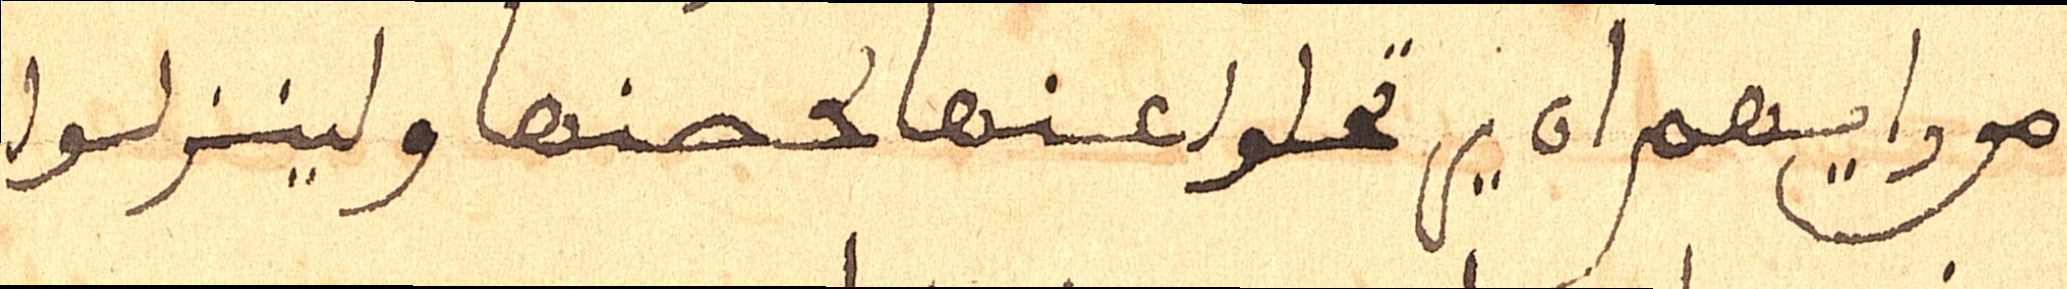من رايهم ان يرتحلوا عنها لحضها و لينزلوا
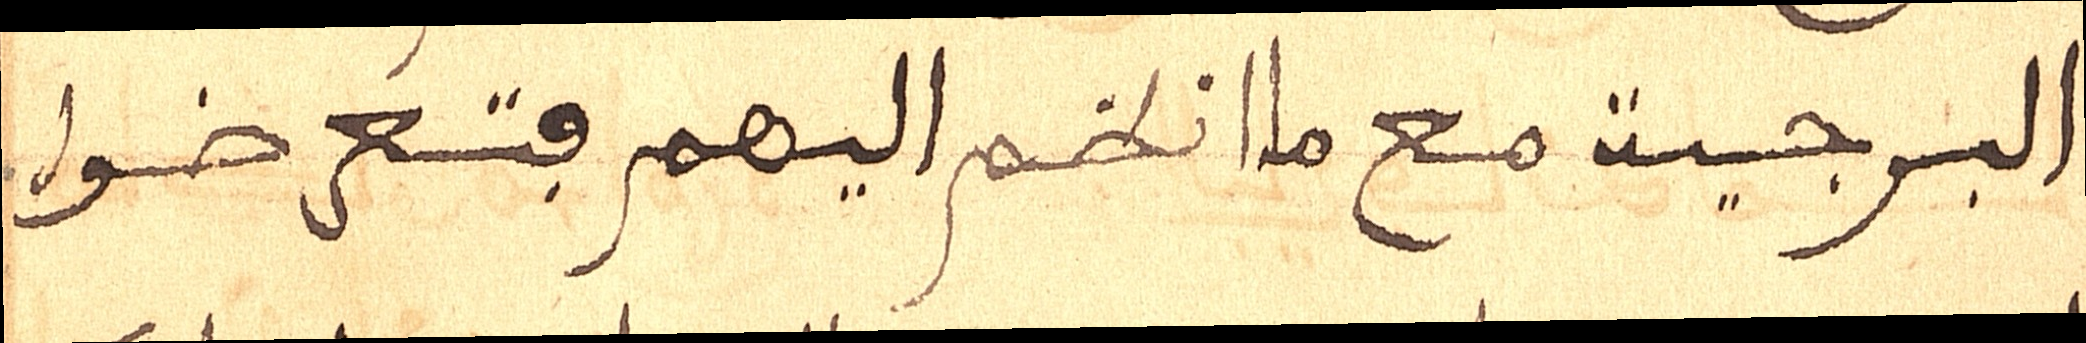البرجية مع ما انظم اليهم فتعرضوا
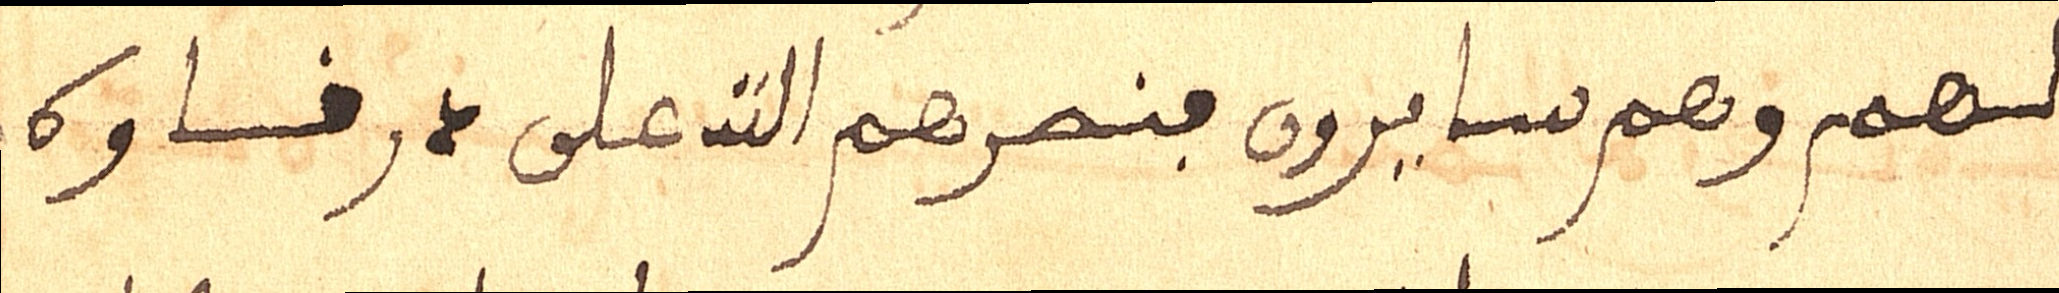لهم وهم سايرون فنصرهم الله على درقاوه
